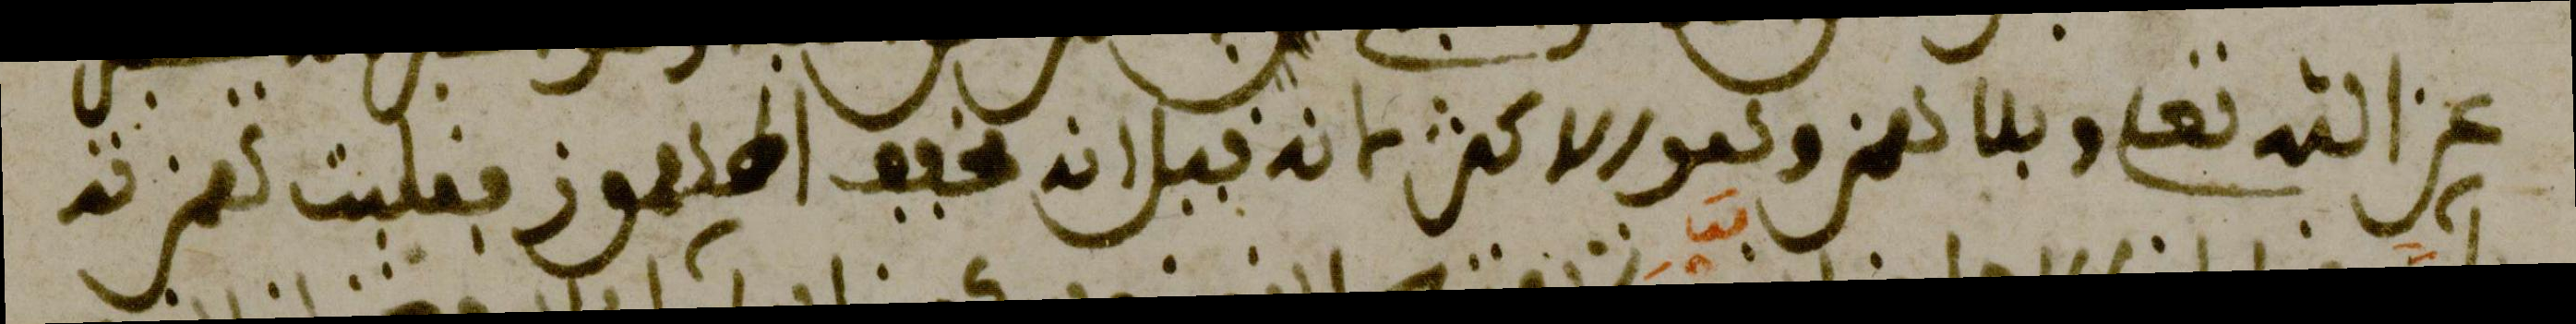عن الله تعلى وبلاهمز وهو الاكثر لانه قيل انه مخفف المهموز فقلبت همزته
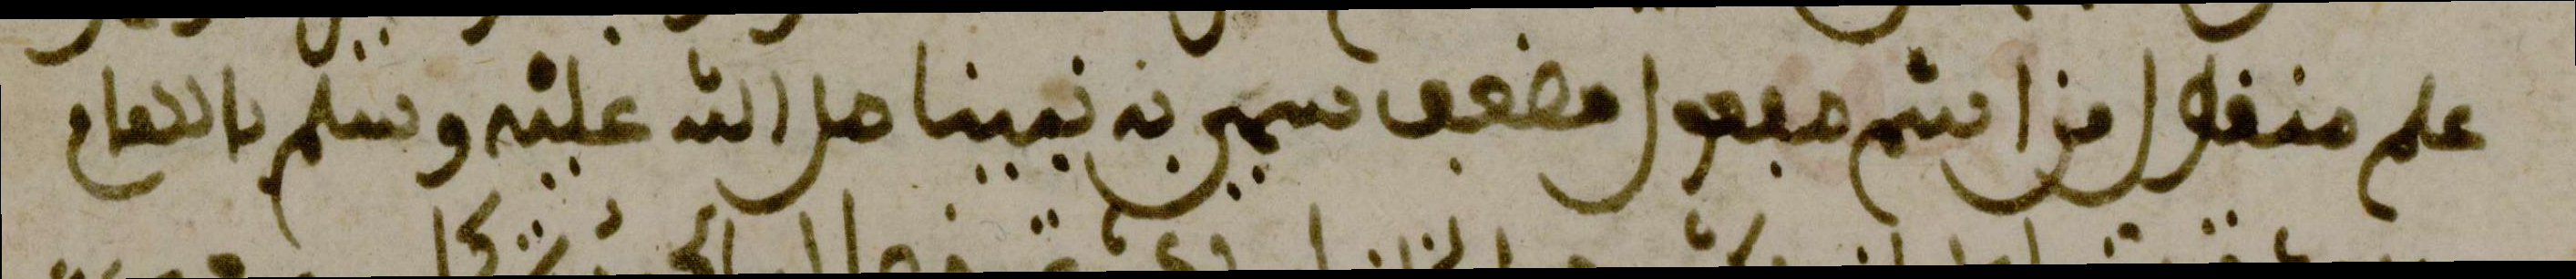علم منقول من اسم مفعول مضعف سمي به نبينا صل الله عليْه وسلم بالهام
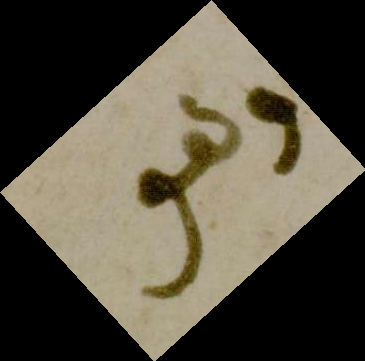وهو
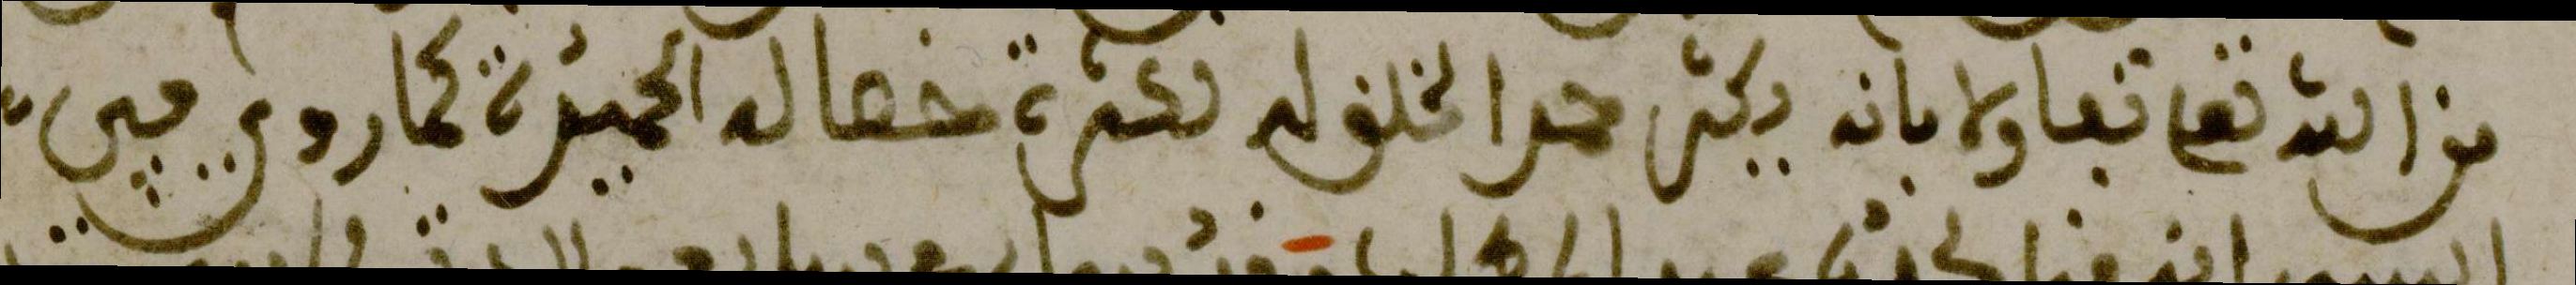من الله تعلى تفا ولا بانه يكثر حمد الخلق له لكثرة خصاله الحميدة كما روي في
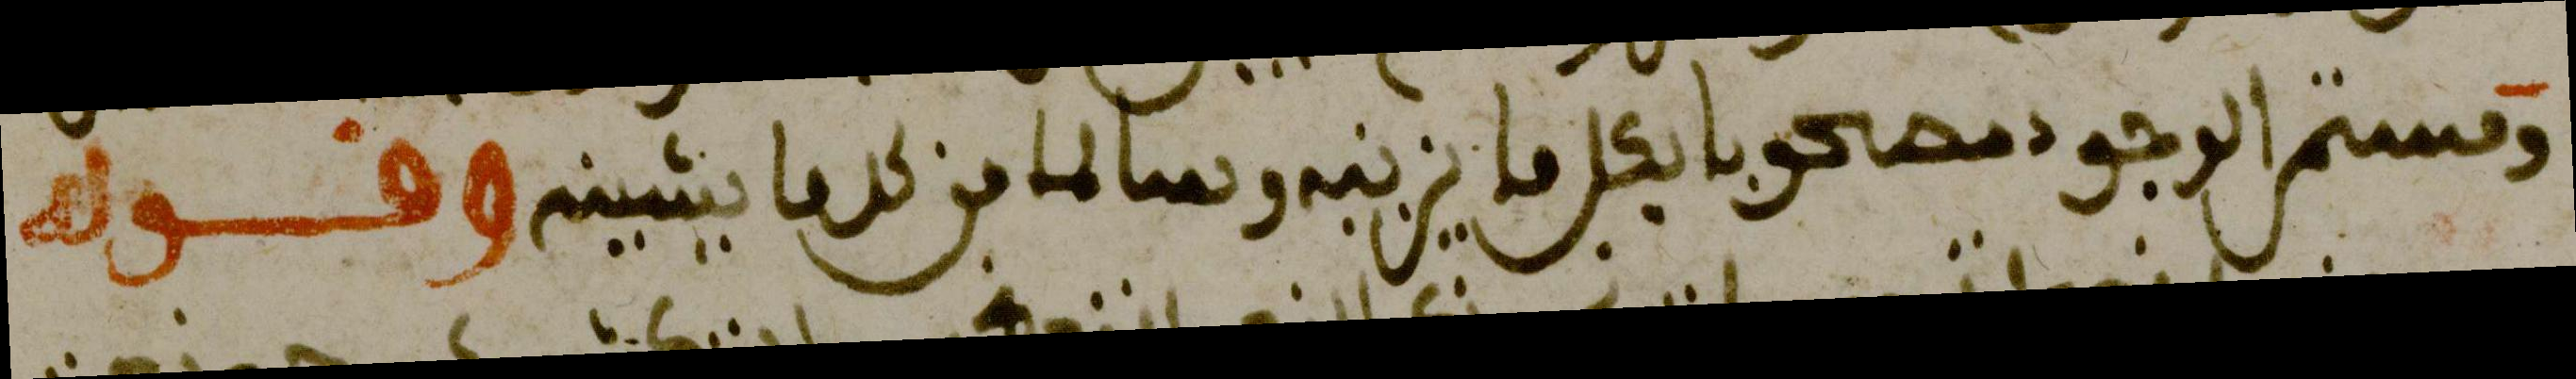ومستمر الوجود مصحوبا بكل ما يزينه وسالما من كل ما يشينه وقوله
